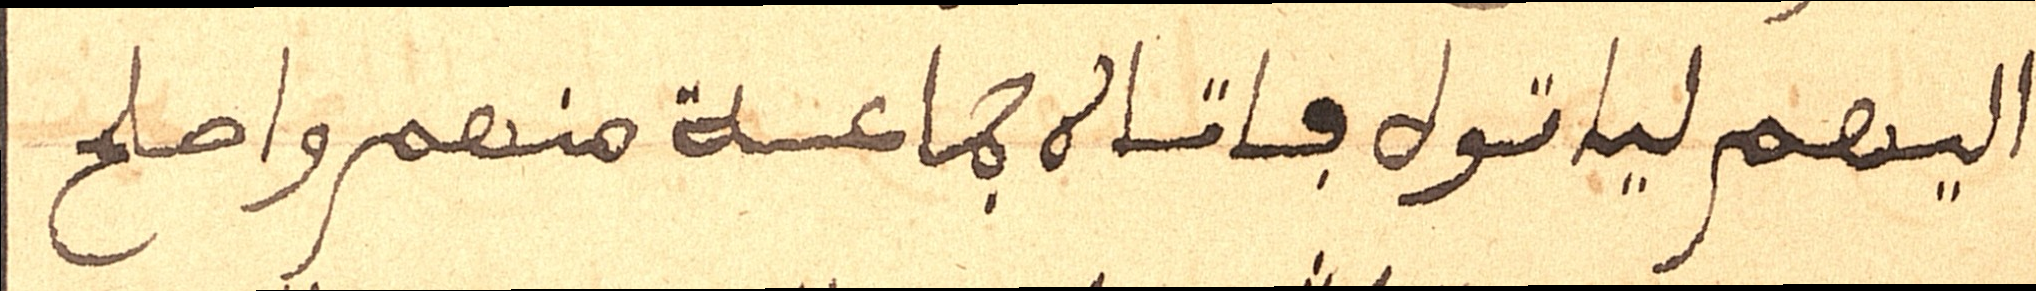اليهم لياتوه فاتاه جماعة منهم واصلح
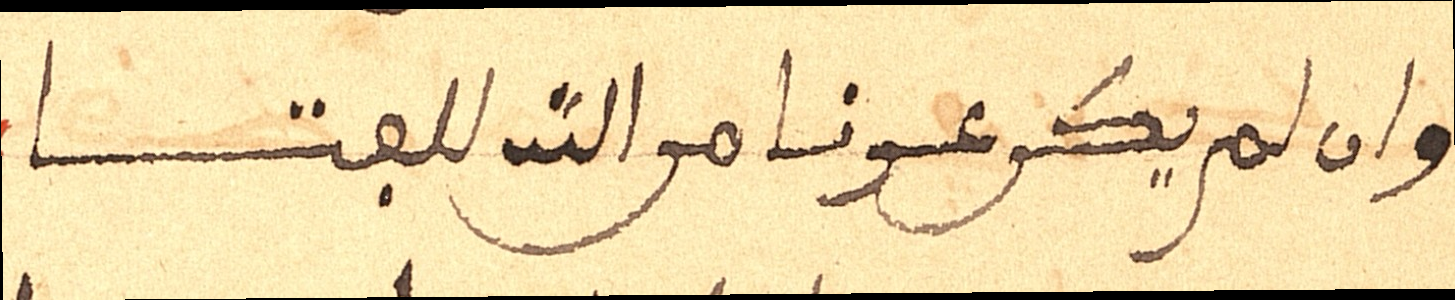وان لم يكن عونا من الله للفتا
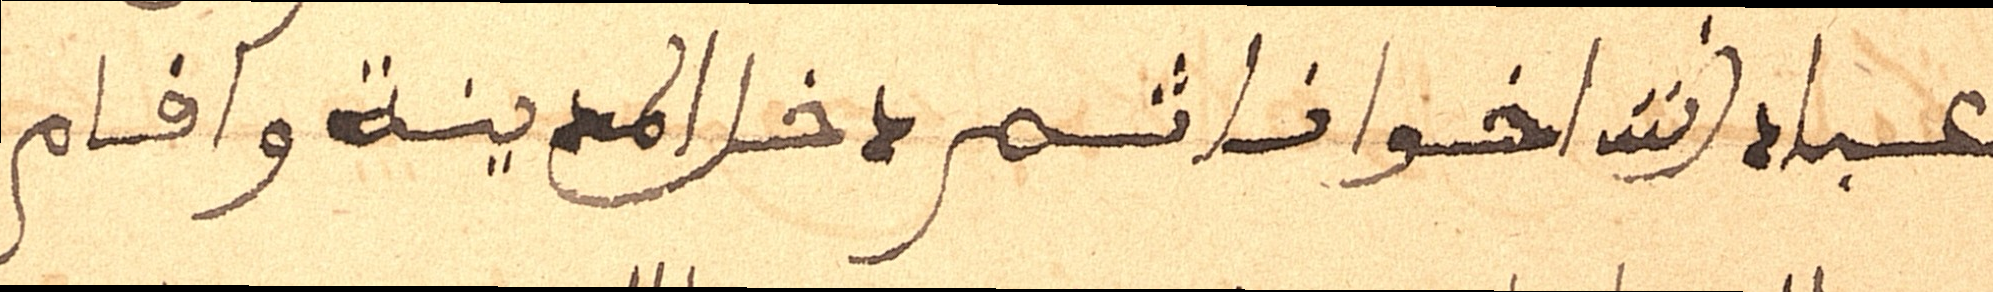عباد الله اخوانا ثم دخل المدينة واقام
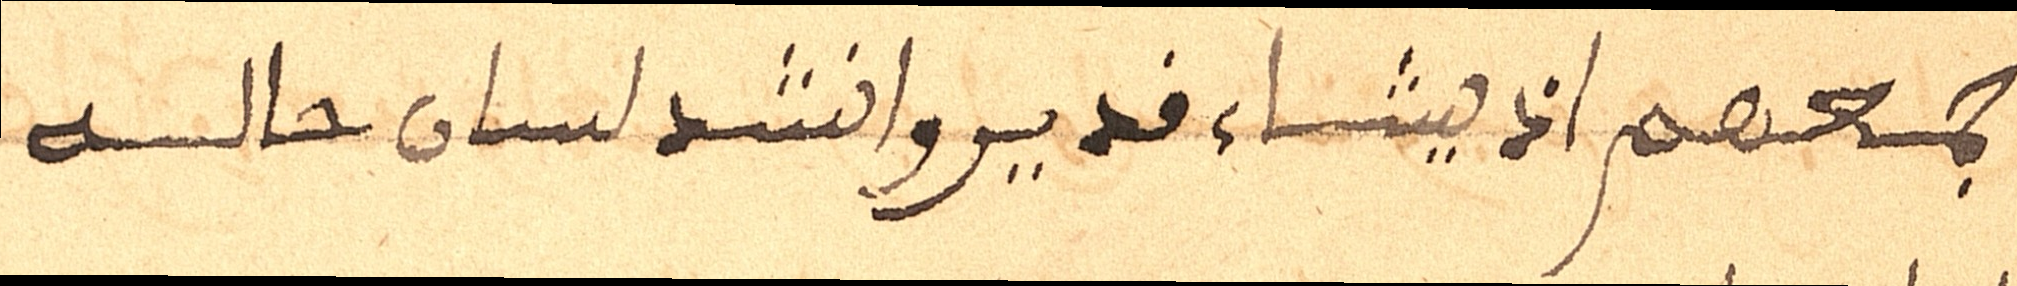جمعهم اذ يشاء قدير وانشد لسان حاله
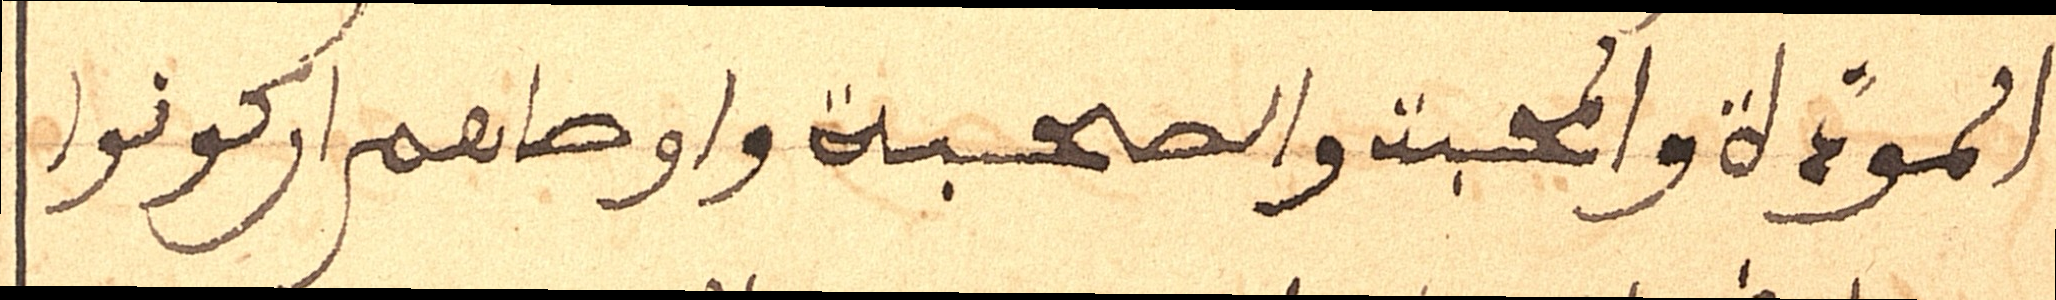المودة والمحبة والصحبة واوصاهم ان كونوا
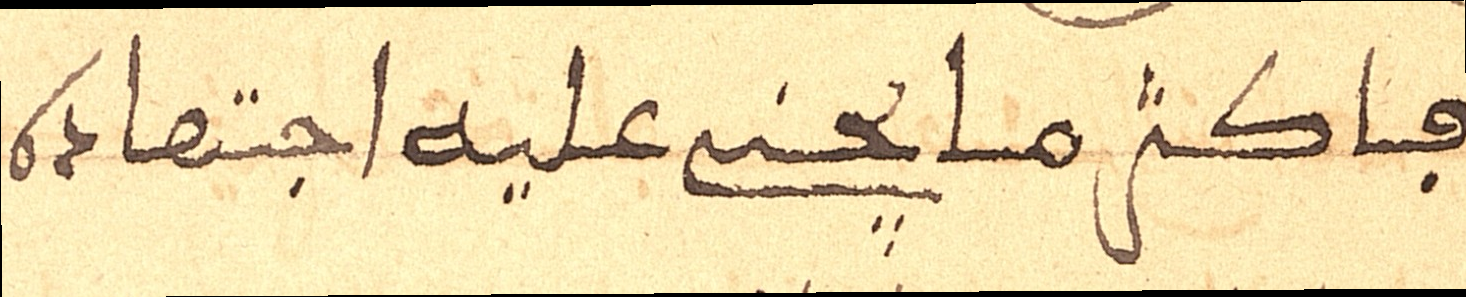فاكثر ما يجنى عليه اجتهاده
